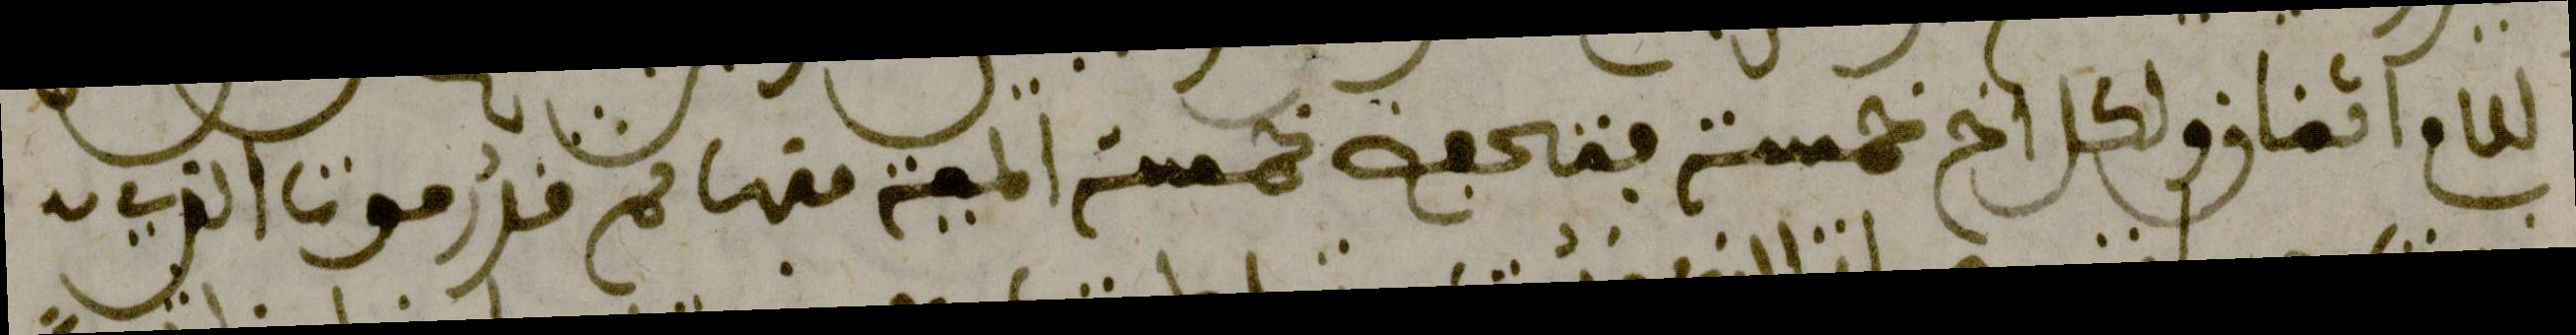للام اثنان ولكل اخ خمسة فتحفض خمسة المية منها ثم قدر موت الذي
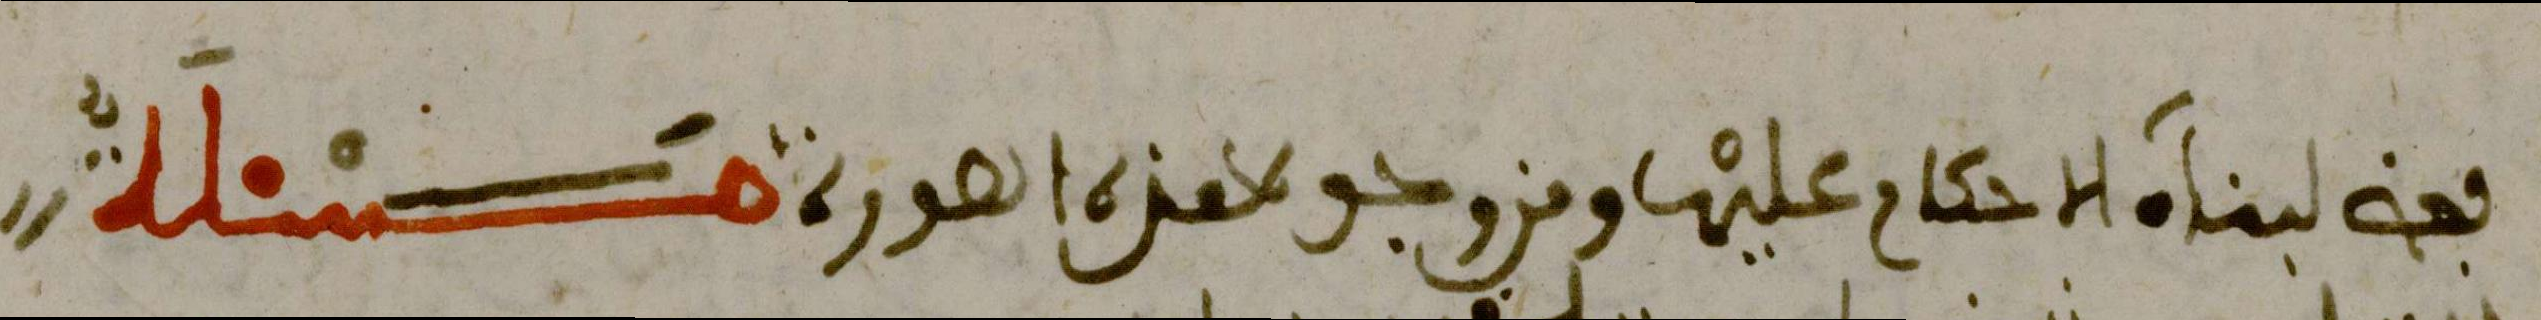بعض لبناء الا حكام عليها ومن وجوه هذه الصورة مسئلة
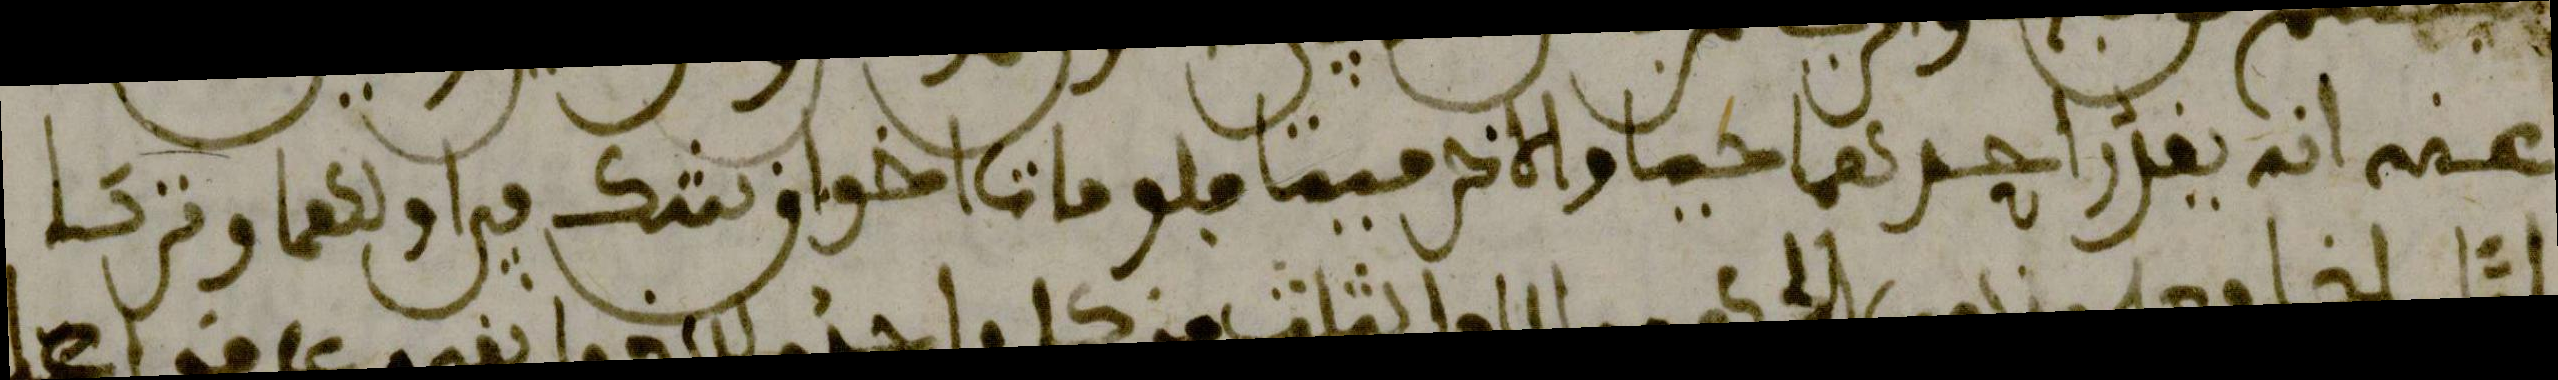عنه انه يقدّر احدهما حيا والاخر ميتا فلو مات اخوان شد في اولهما وتركا
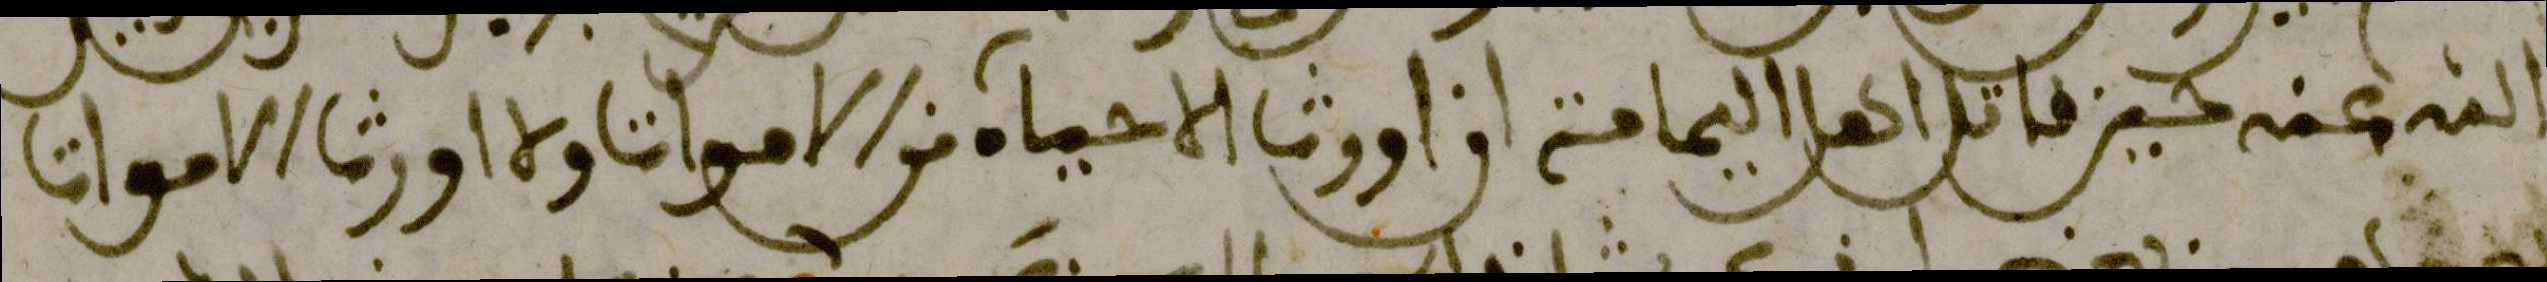الله عنه حين قاتل اهل اليمامة ان اورث الاحياء من الاموات ولا اورث الاموات
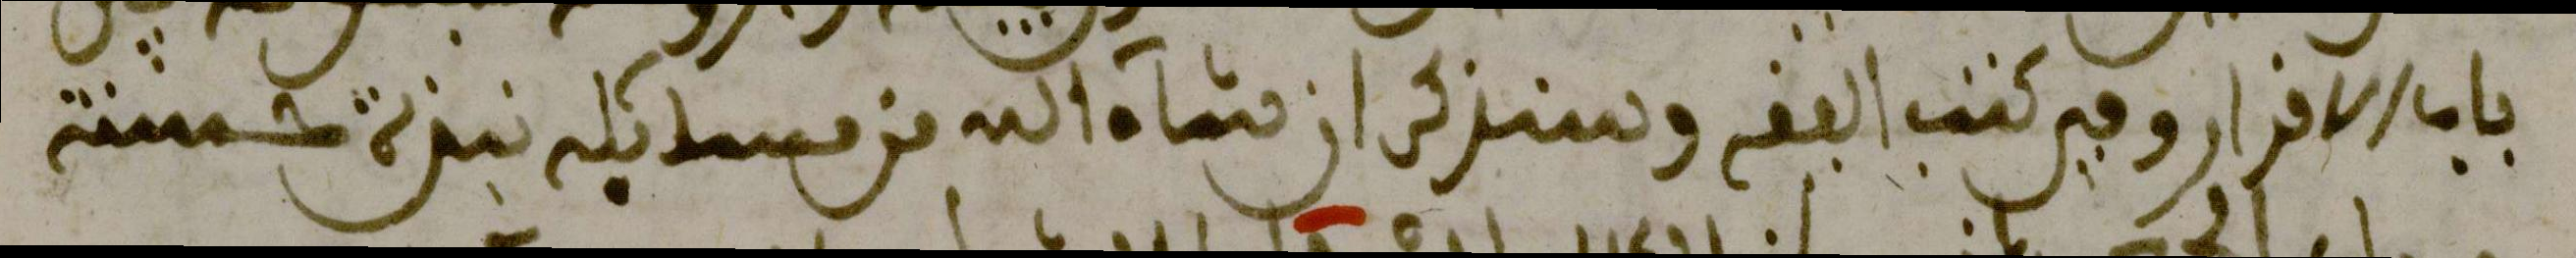باب الاقرار وفي كتب الفقه وسنذكر ان شاء الله من مسائله نبذة حسنة
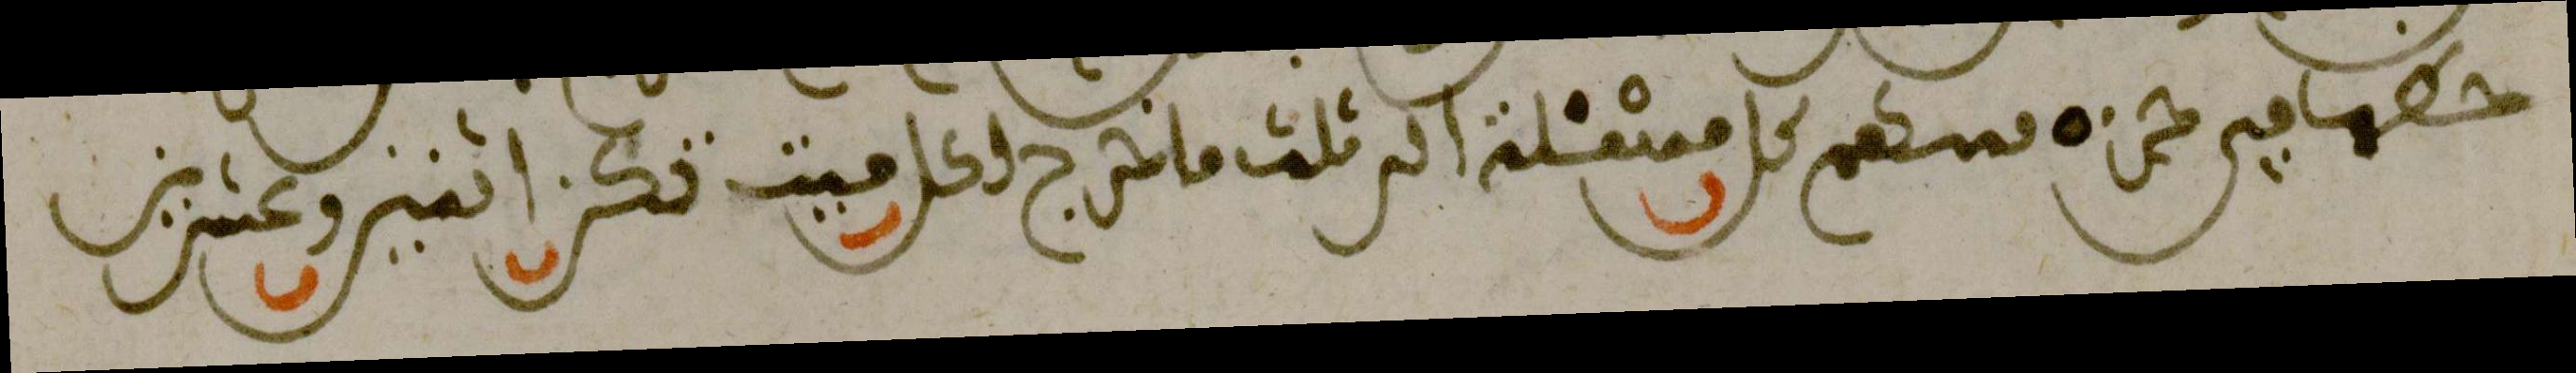حظها في جزء سهم كل مسئلة الى ثلث ما خرج لكل ميت تكن اثنين وعشرين
